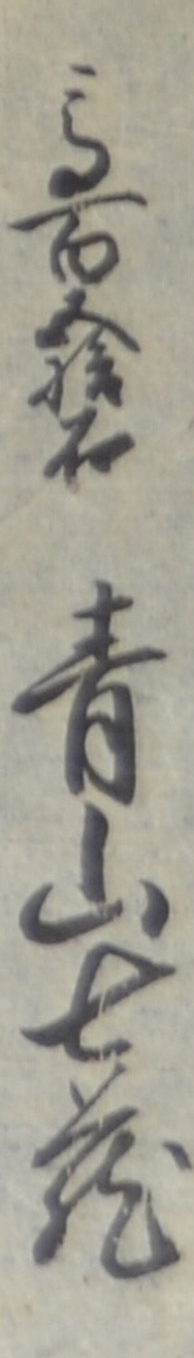高百五拾石青山七蔵
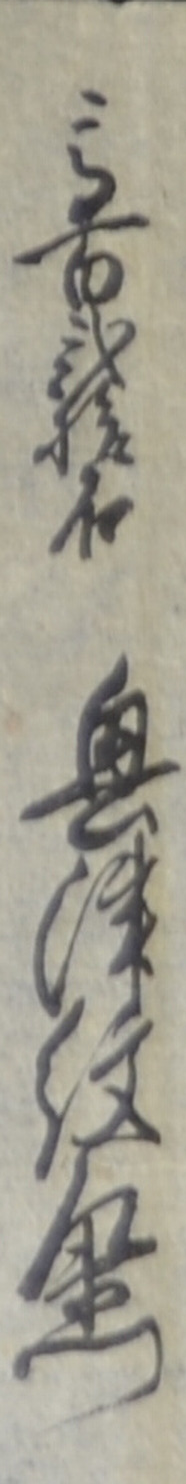高百弐拾石奥津紋左衛門
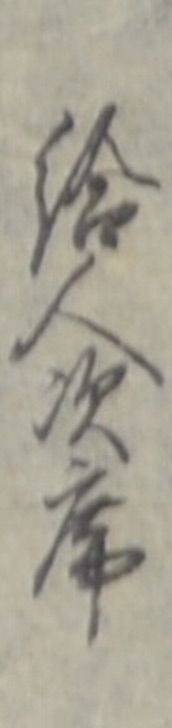給人次席
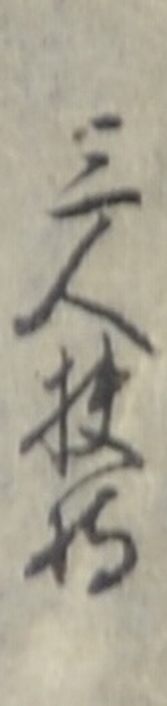三人扶持
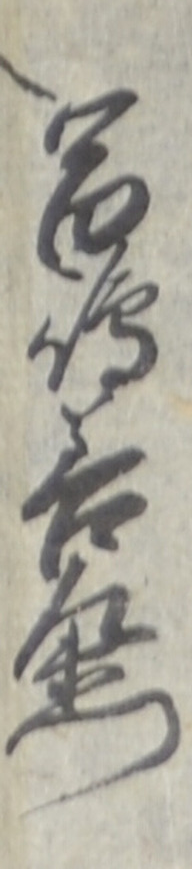冨嶋善左衛門
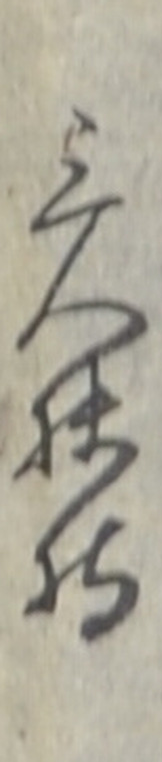三人扶持
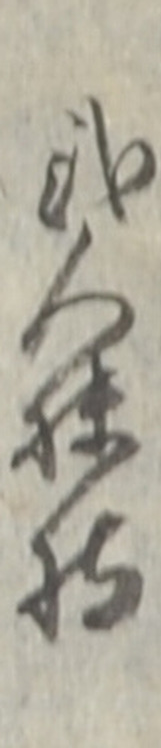弐人扶持
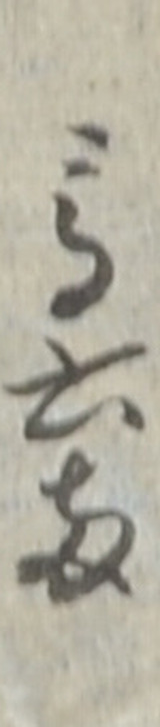高五両
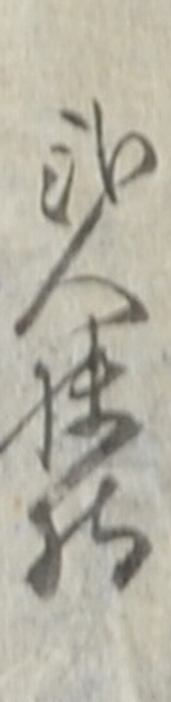弐人扶持
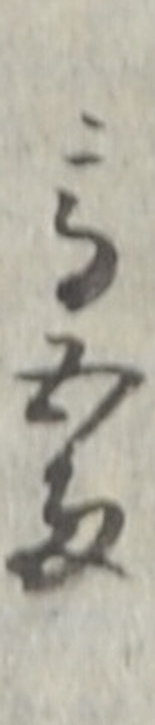高五両
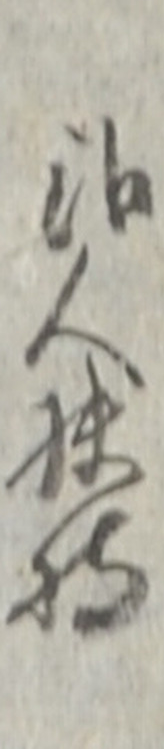弐人扶持
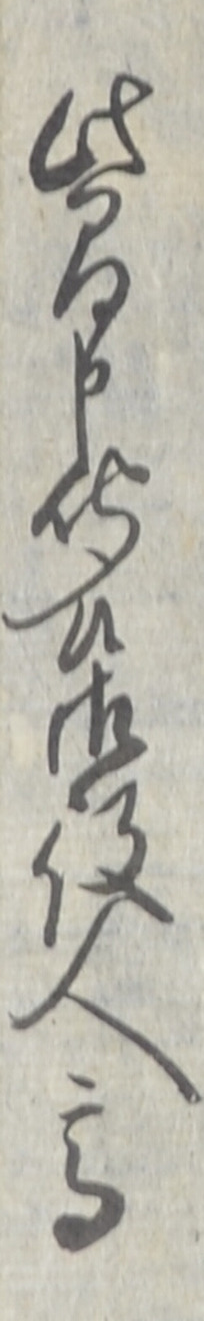此間申聞候御役人高
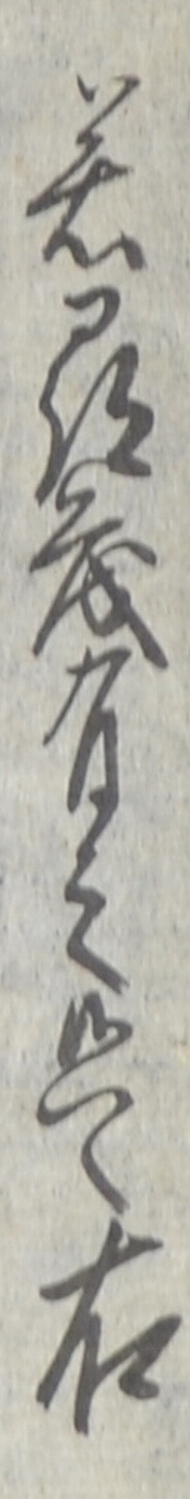若尋茂有之候ハヽ右
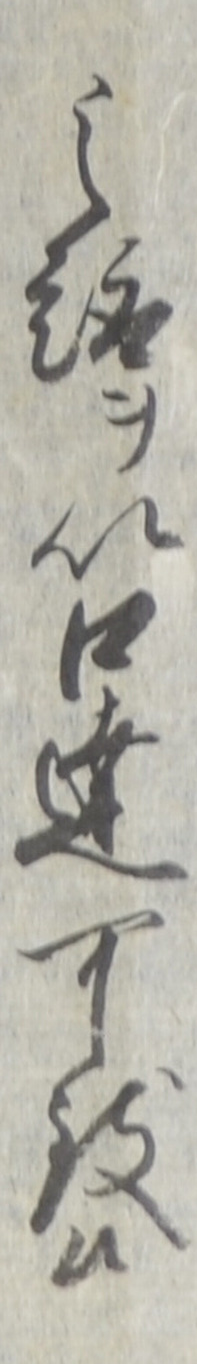之趣ヲ以口達可致候
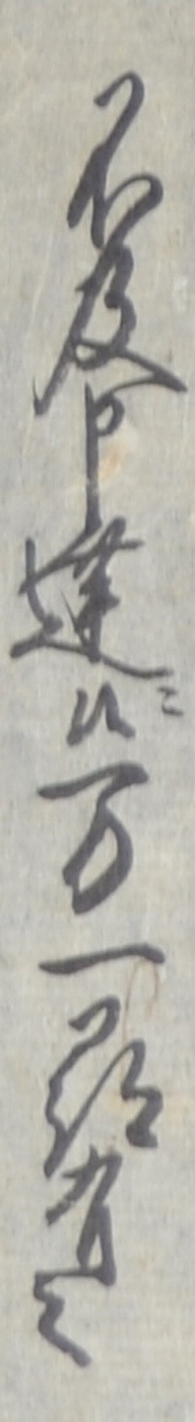不及申達ニ候万一尋有之
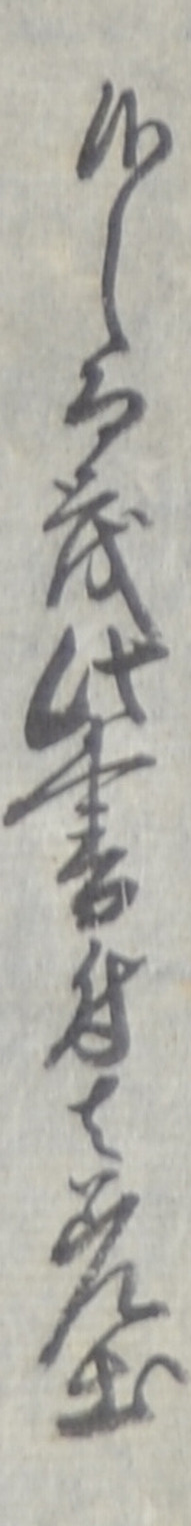候之而茂此書付は差出
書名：（覚）
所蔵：伊那市立高遠町図書館・合同会社AMANE
